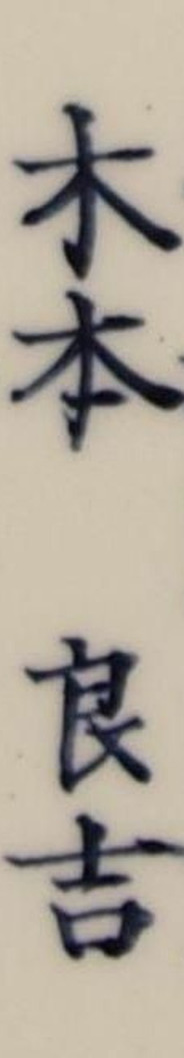木本良吉
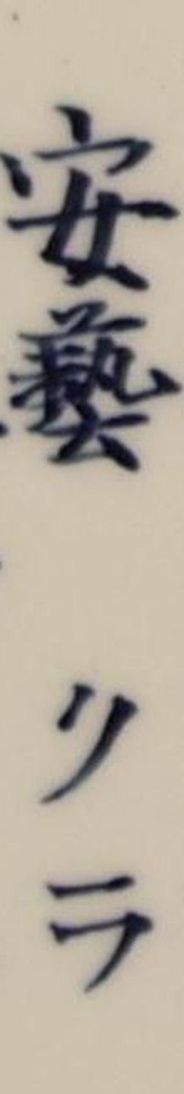安藝クラ
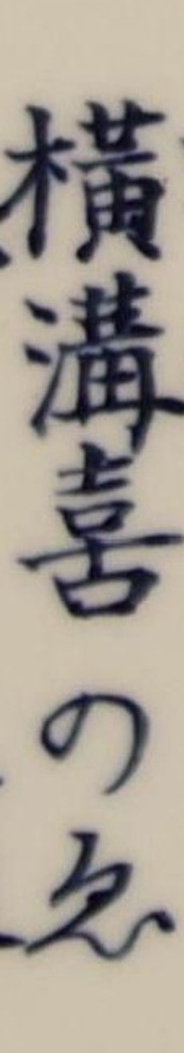横溝きのゑ
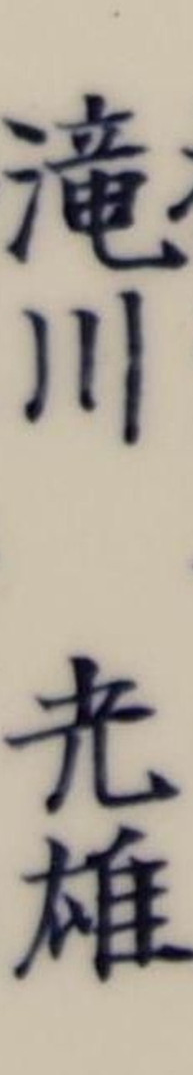滝川光雄
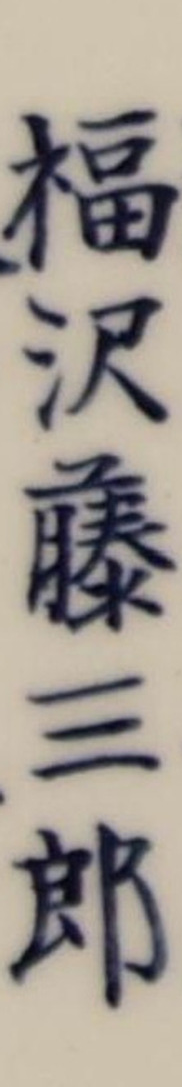福沢藤三郎
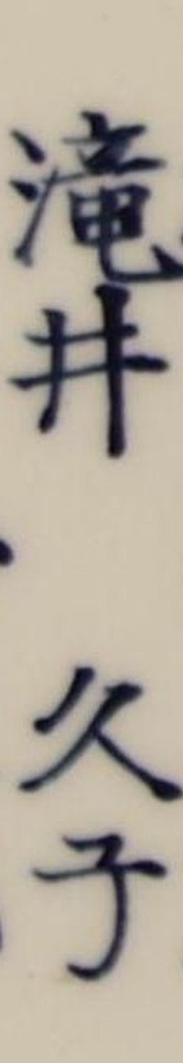滝井久子
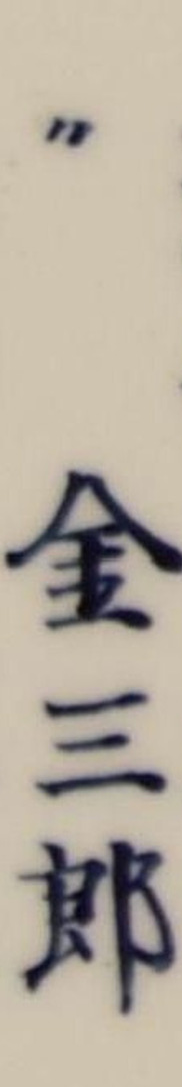金三郎
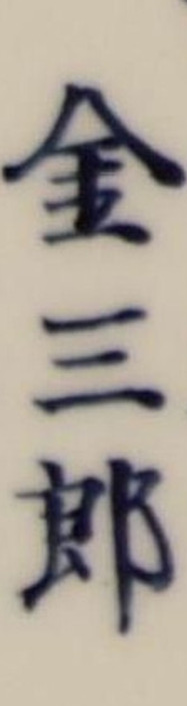金三郎
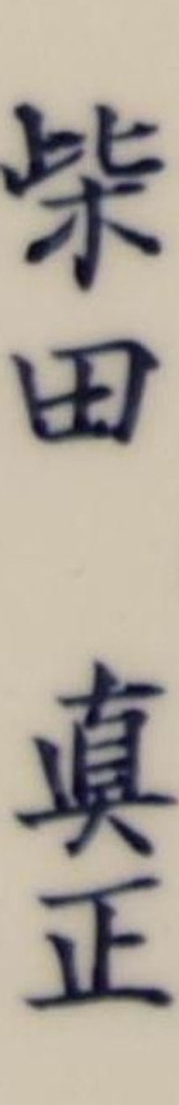柴田真正
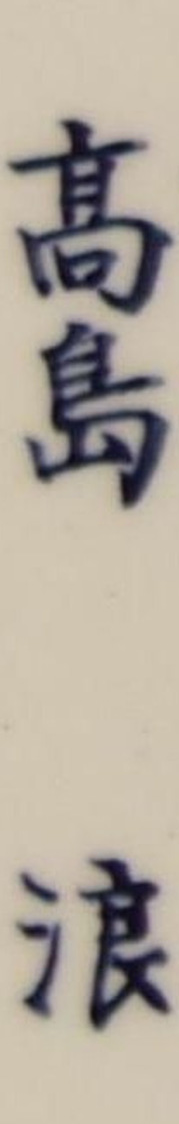高島浪
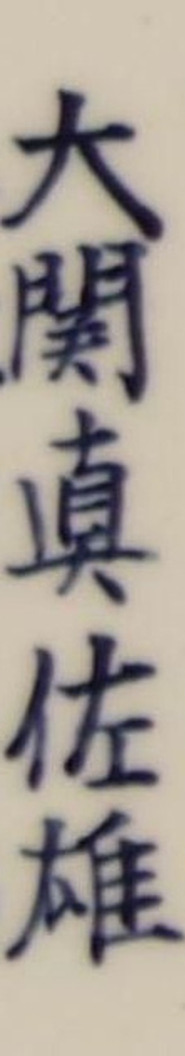大関真佐雄
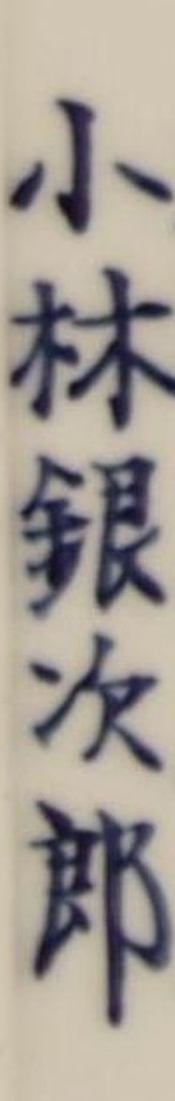小林銀次郎

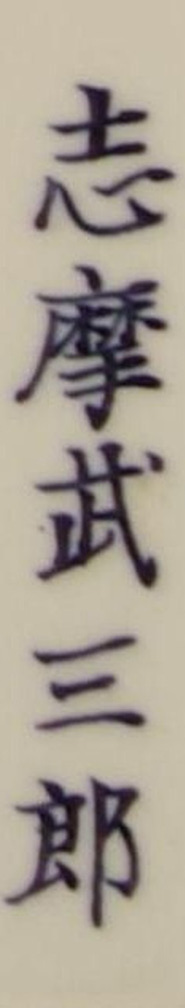志摩武三郎
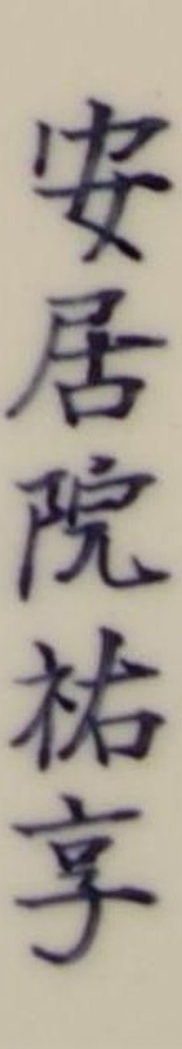安居院祐序
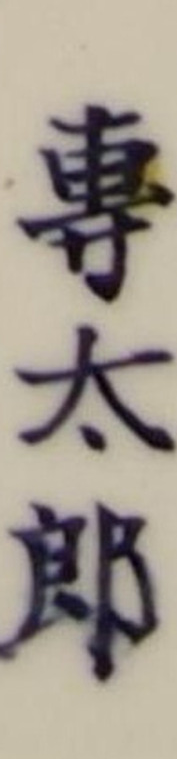専太郎
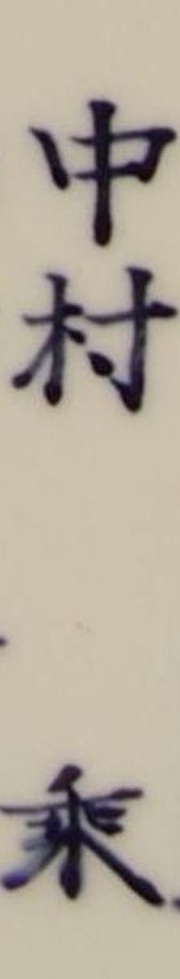中村乗
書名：M~S
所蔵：高野山金剛峯寺
